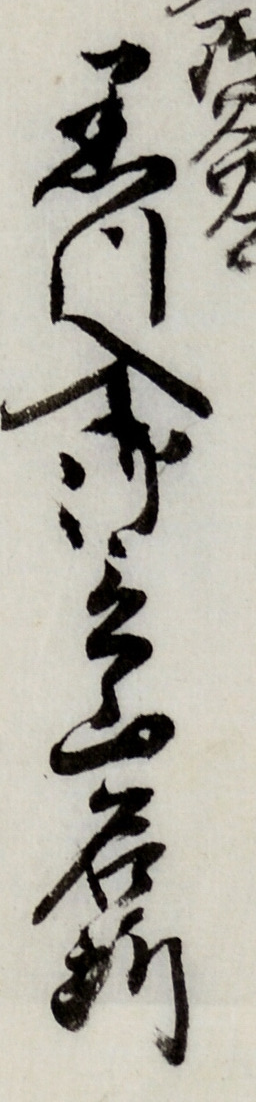黒川入御立山名所
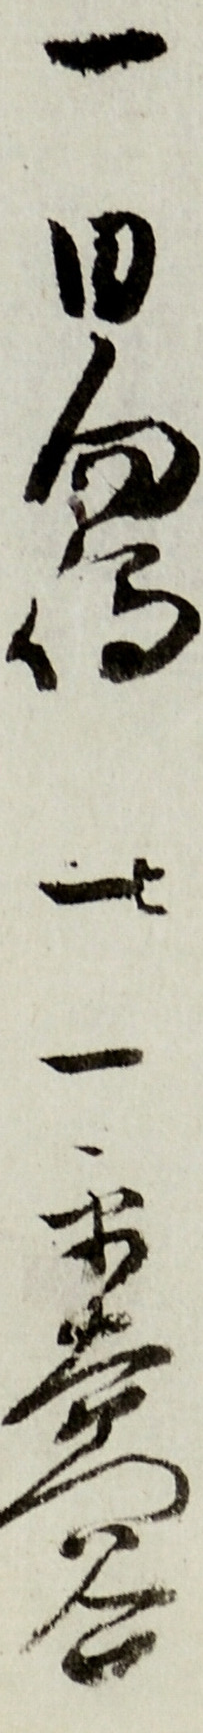一日向嶋一平右衛門谷

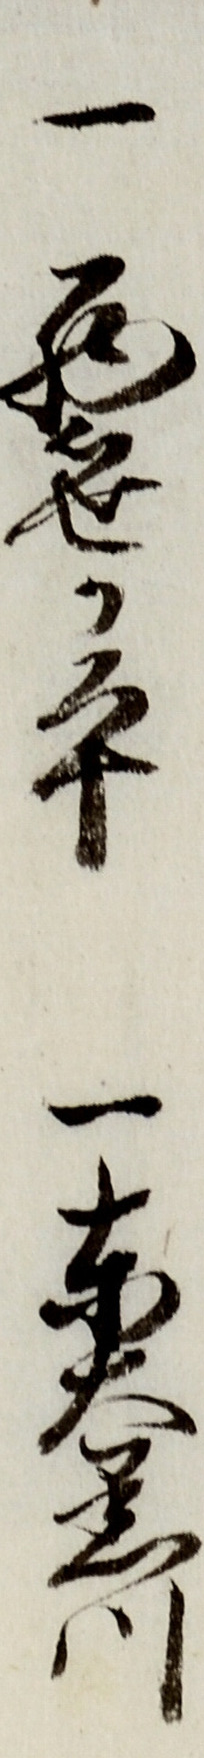一西笹か平一東大黒川
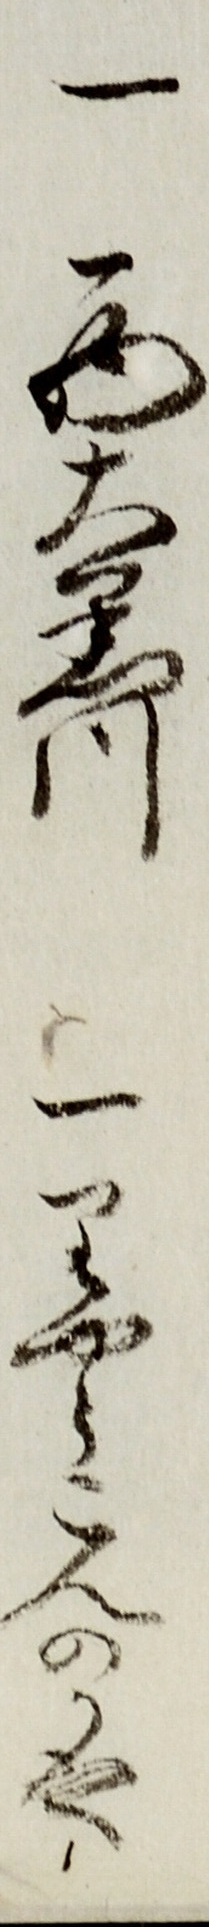一西大黒川一りやうこんのかや
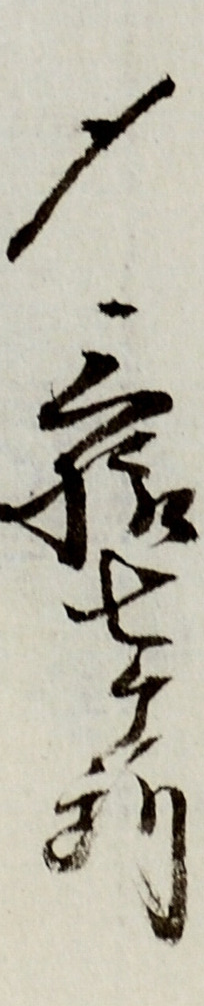〆三拾七ケ所
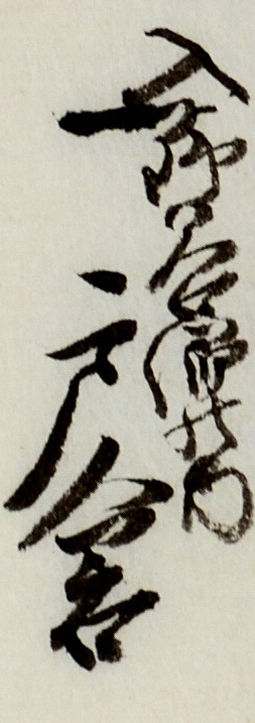一戸倉
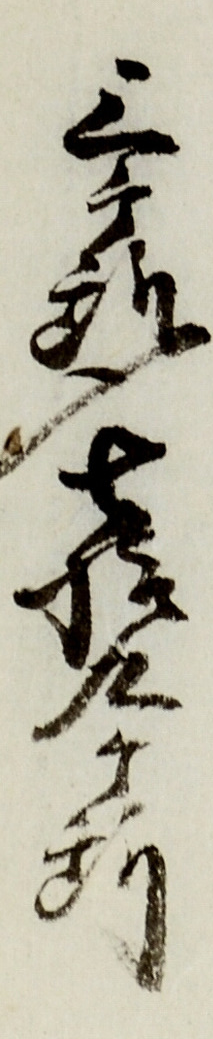三ケ所〆七拾九ケ所
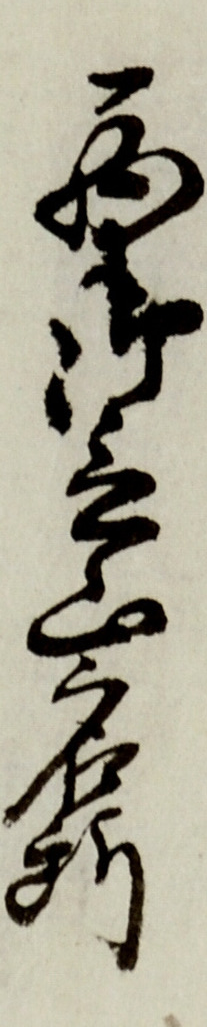西御立山名所
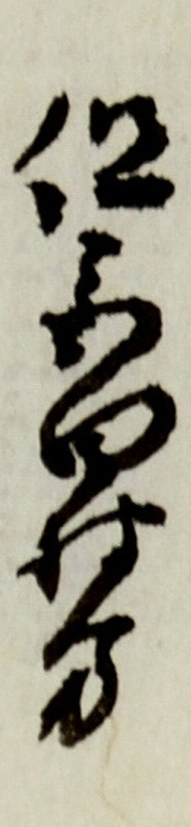但宮田村方
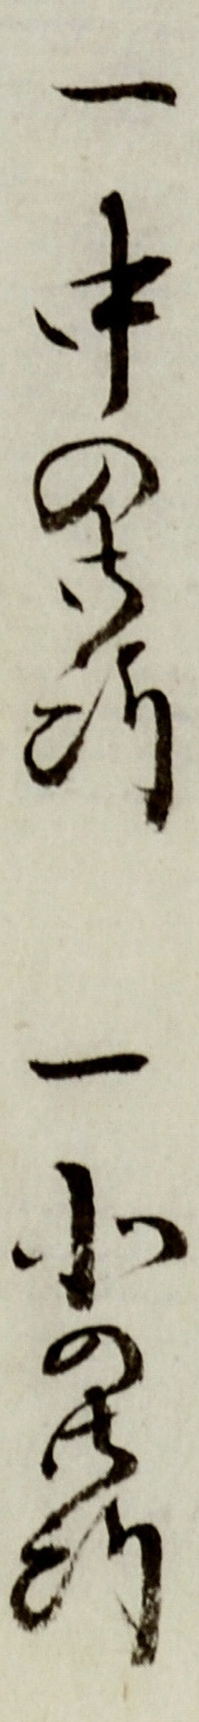一中の御所一北の御所
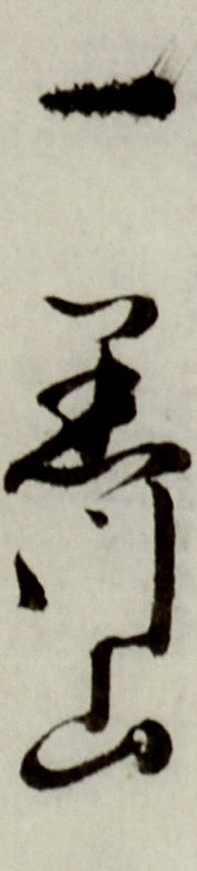一黒川山
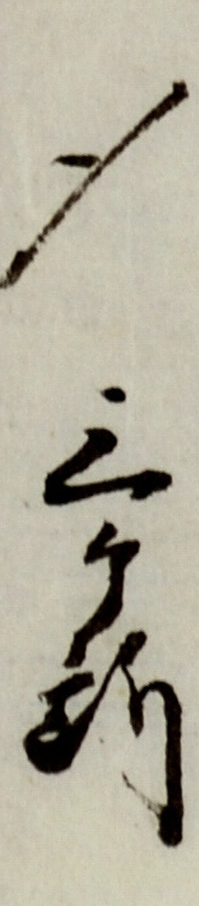〆三ケ所

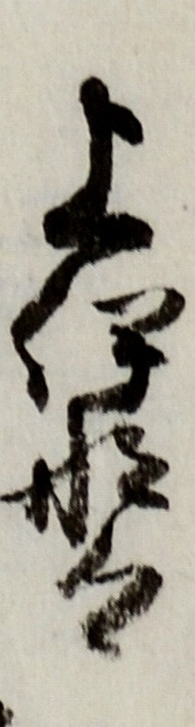上伊那郷
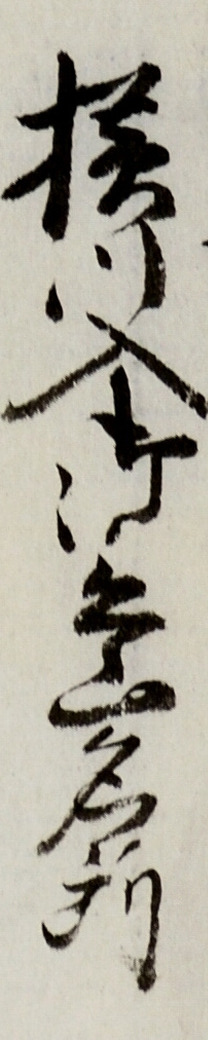横川入御立山名所
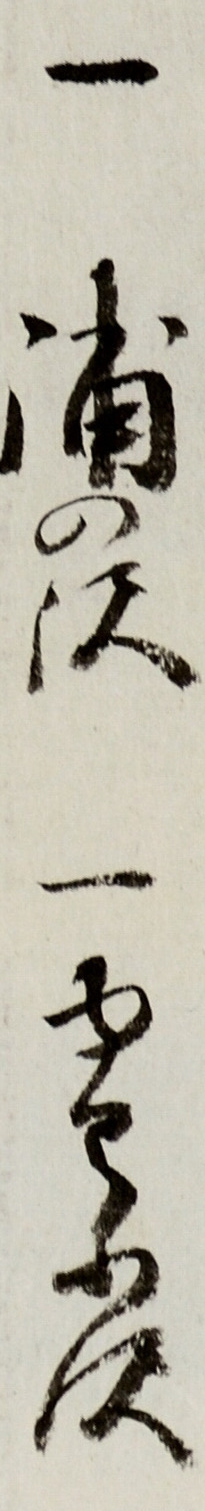一浦の沢一ゆわふ沢
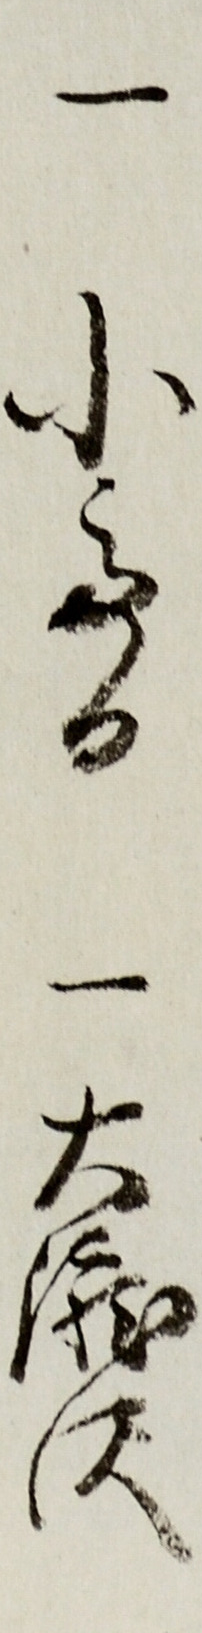一小たる一大瀧沢
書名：御領分御立山名所附帳
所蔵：伊那市立高遠町図書館・合同会社AMANE
